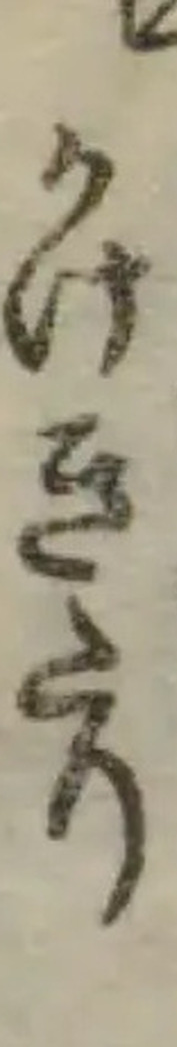かけきたり
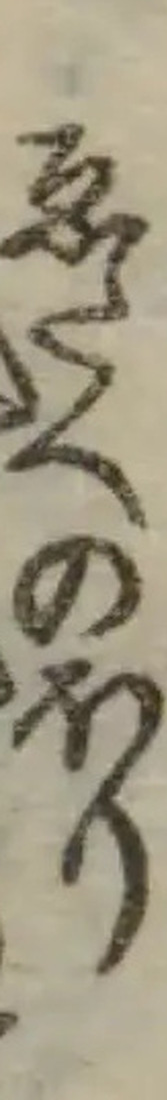ゑたへのほり
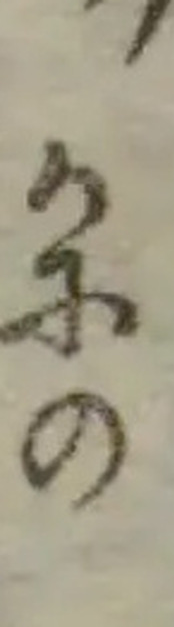かにの
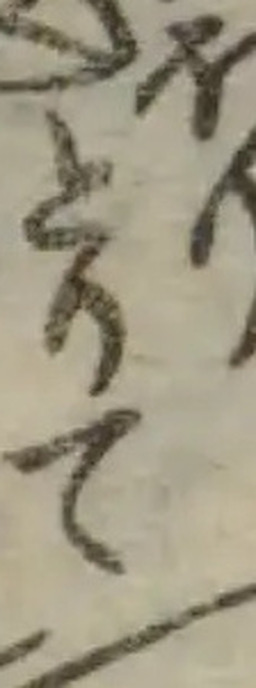とりて
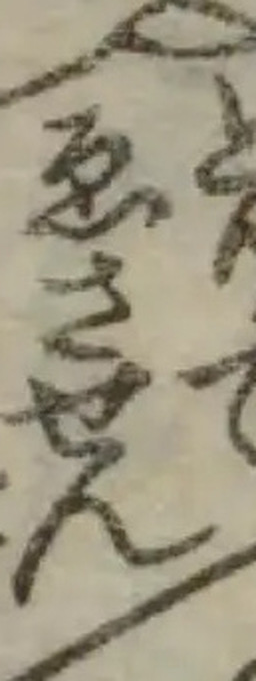ゑさせん
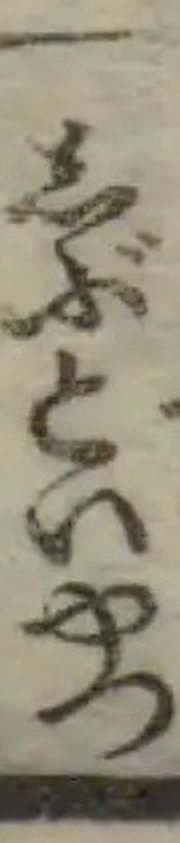しぶといやつ
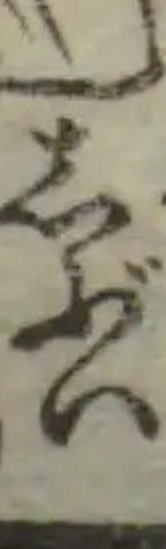しぶい
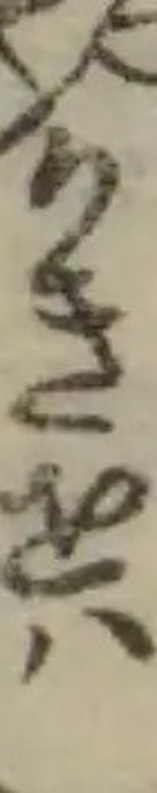かきをは
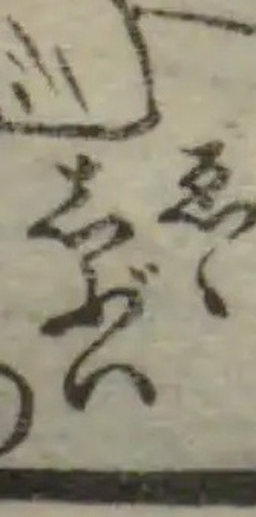しぶい
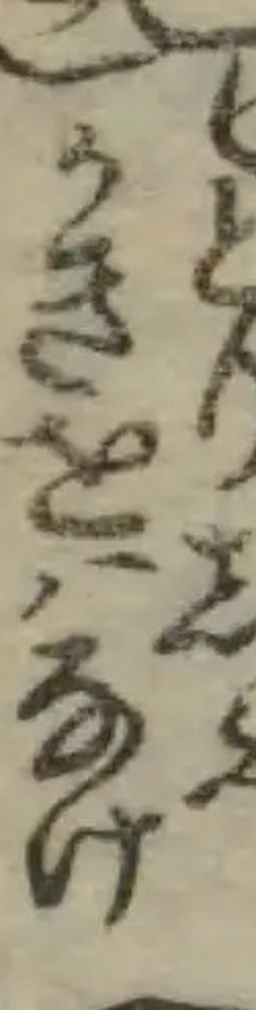かきをはなけ

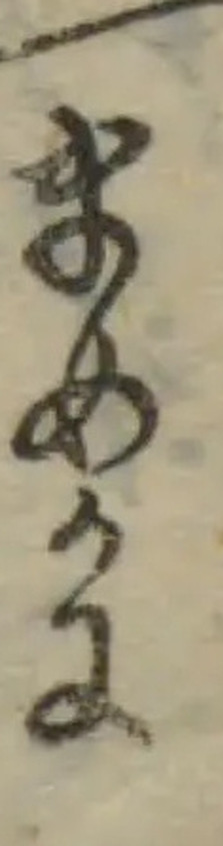まめかに
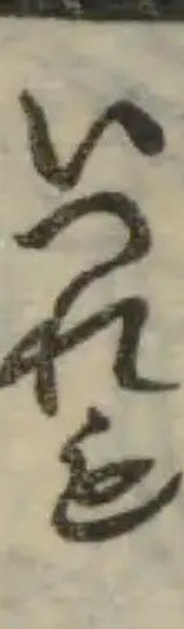いつれも
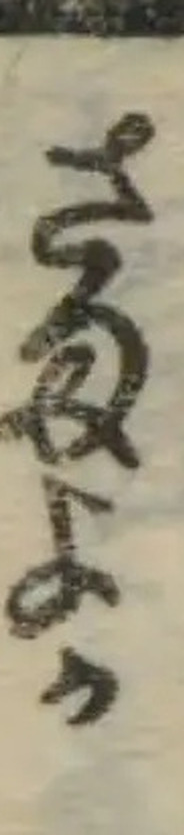さまよか
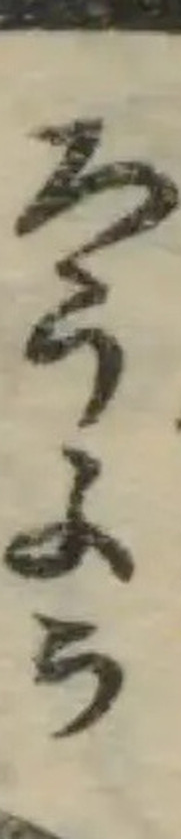ろうよう
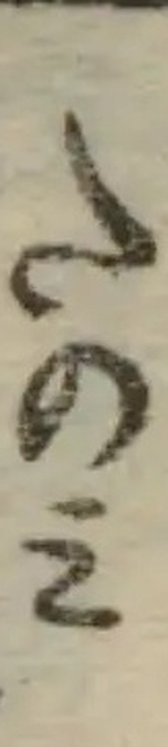たのみ
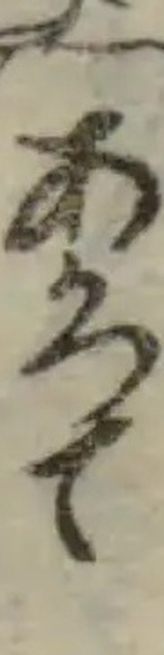あかつて
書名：さるかに合戦
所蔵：国立国会図書館 National Diet Library, JAPAN
